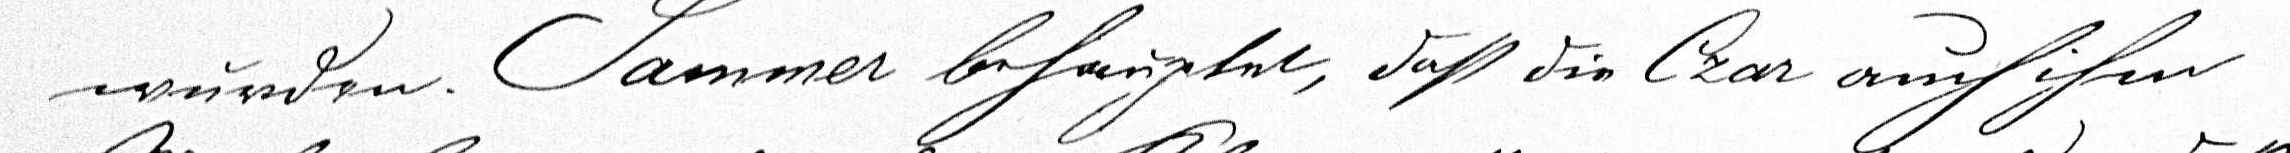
wurden. Sammer behauptet, daß die Czar auch ihm
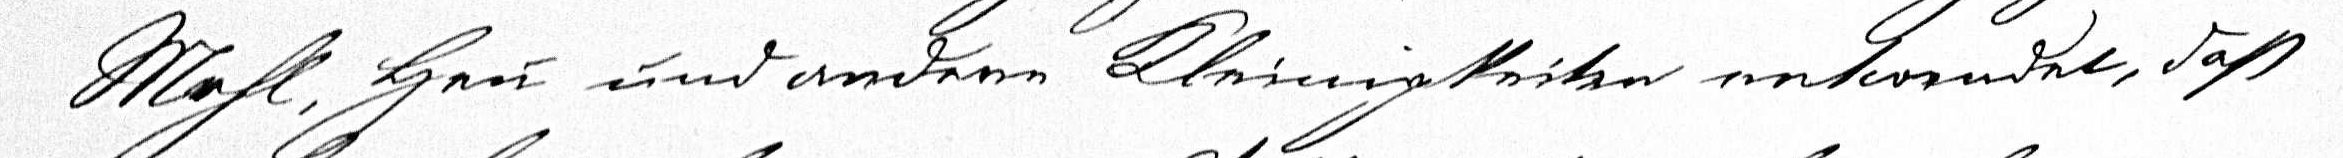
Mehl, Heu und andere Kleinigkeiten entwendet, daß
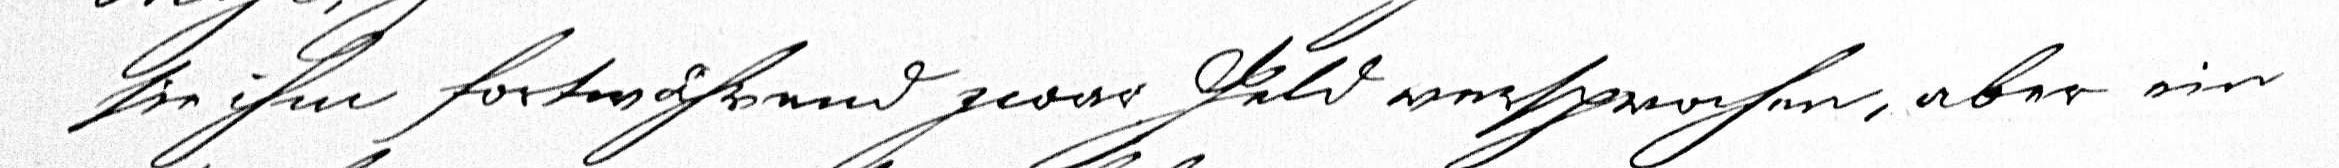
sie ihm fortwährend zwar Geld versprochen, aber ein
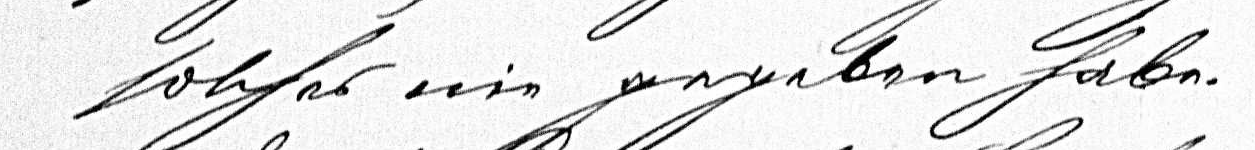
solches nie gegeben habe.
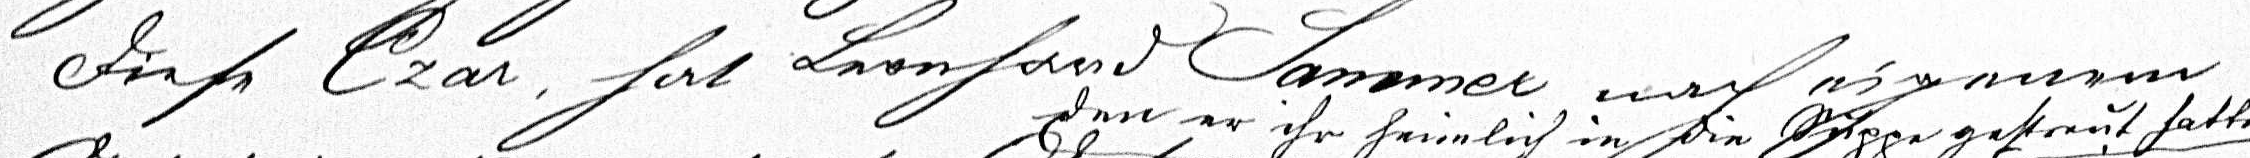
Diese Czar, hat Leonhard Sammer nach eigenem
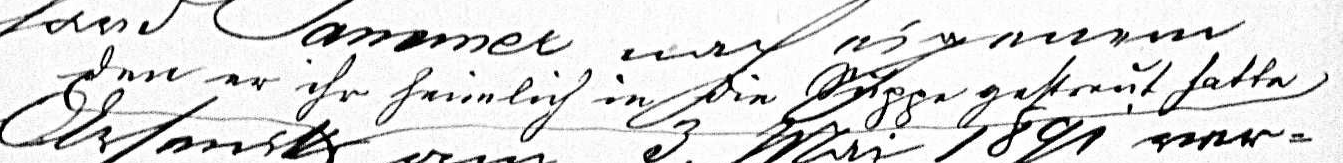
den er ihr heimlich in die Suppe gestreut hatte
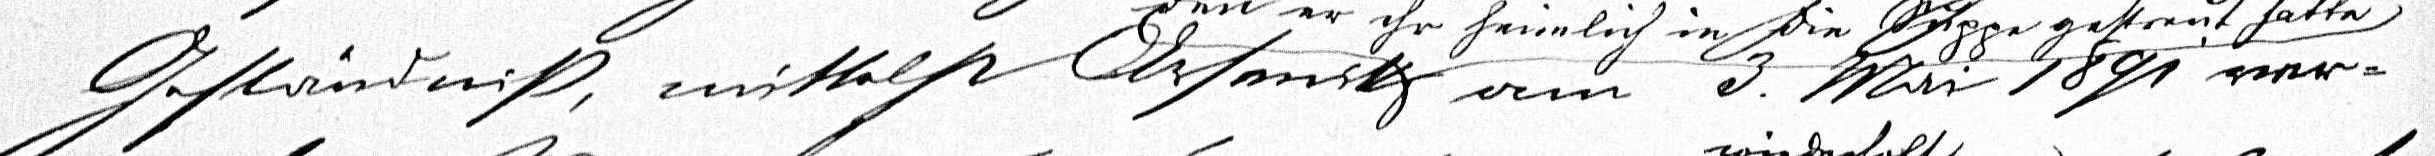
Geständniß, mittels Arsenik, am 3. Mai 1891 ver¬
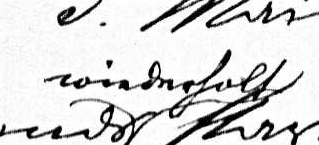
wiederholt
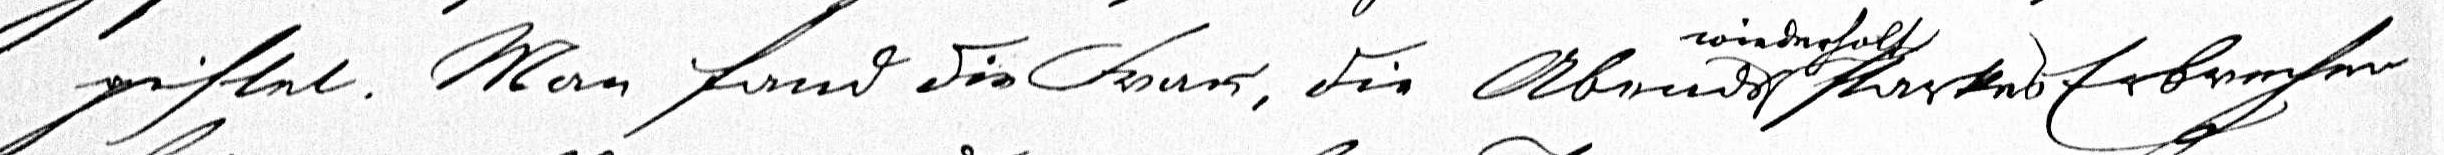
giftet. Man fand die Frau, die Abends starkes Erbrechen
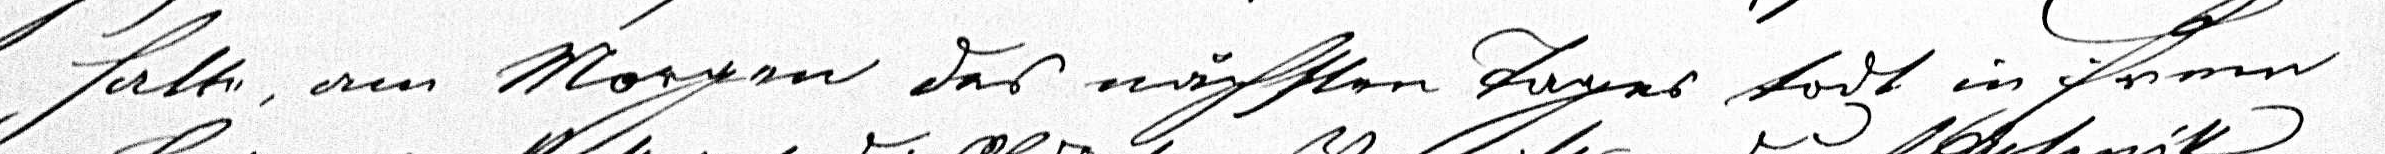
hatte, am Morgen des nächsten Tages todt in ihrem
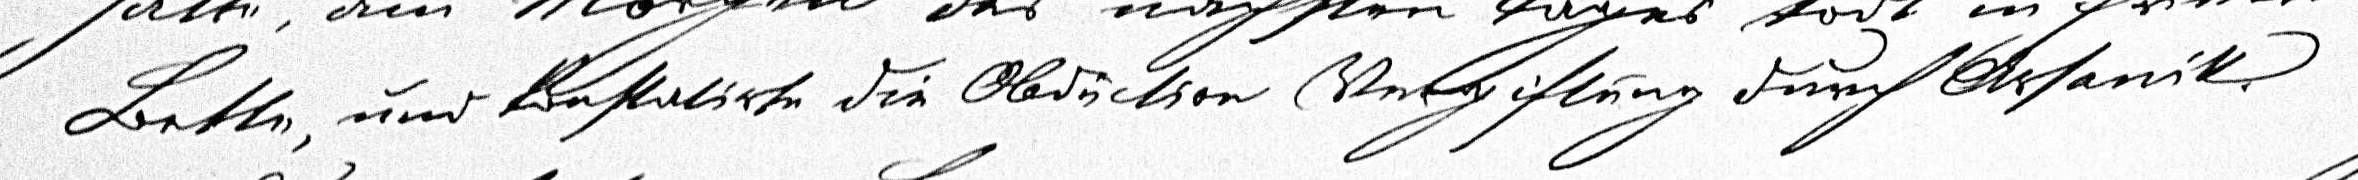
Bette, und konstatirte die Obduction Vergiftung durch Arsenik.
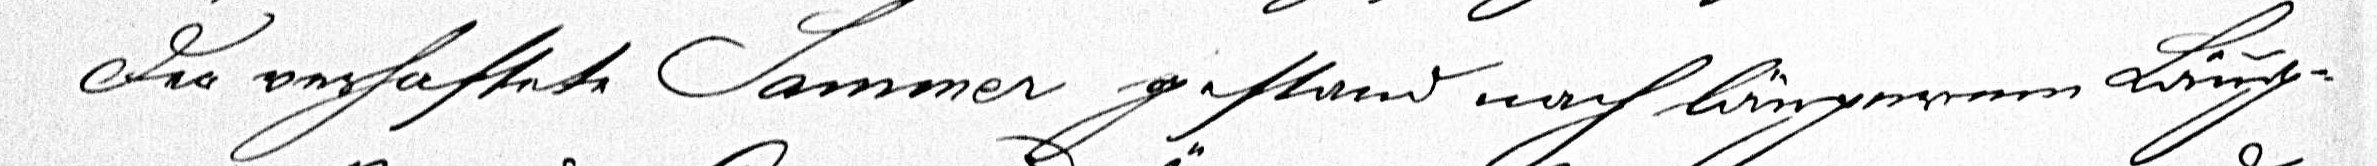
Der verhaftete Sammer gestand nach längerem Läug¬
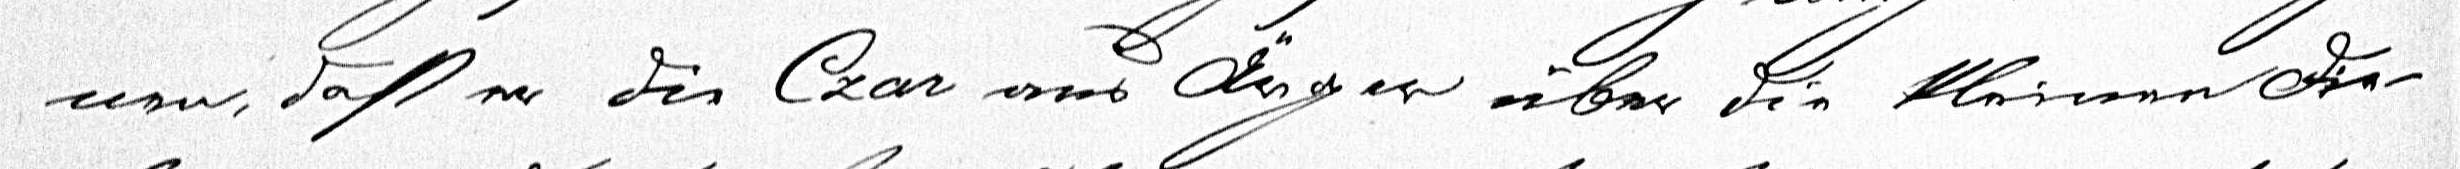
nen, daß er die Czar aus Ärger über die kleinen Die¬
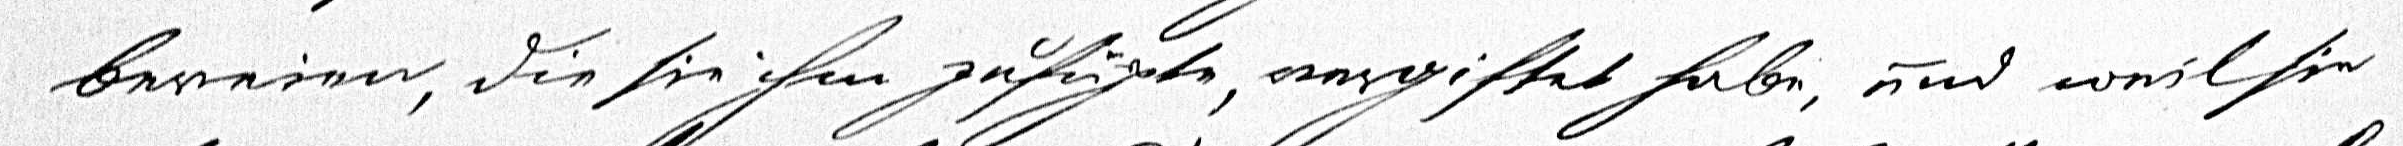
bereien, die sie ihm zufügte, vergiftet habe, und weil sie
